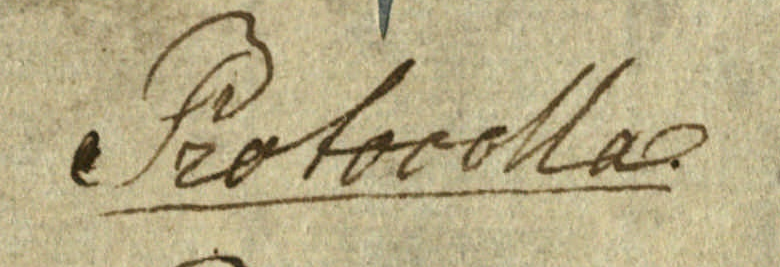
Protocolla
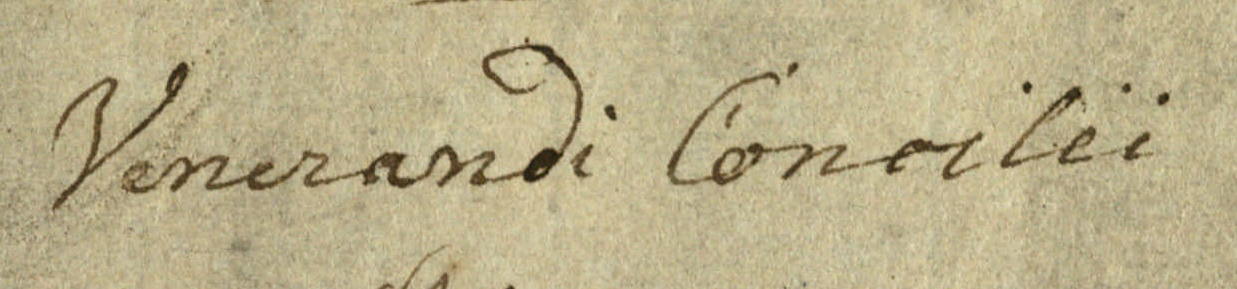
Venerandi Concilii
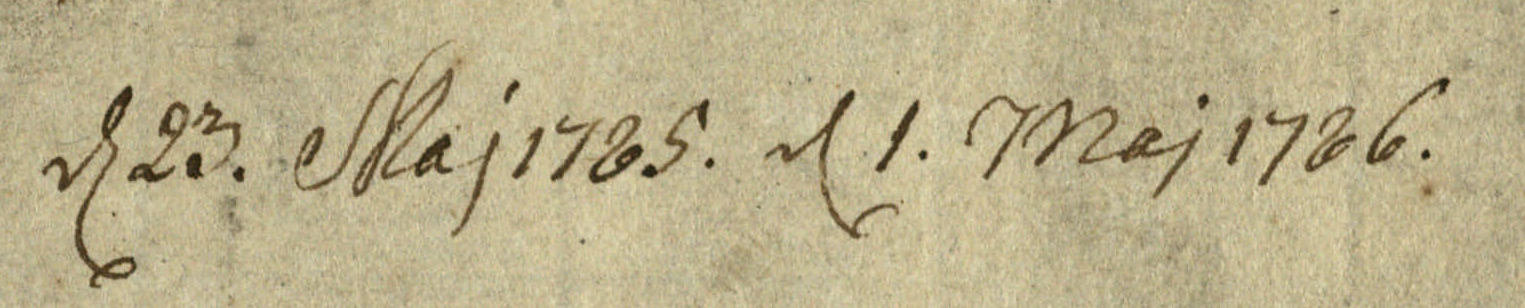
d. 23. Maj 1785. d. 1. Maj 1786.
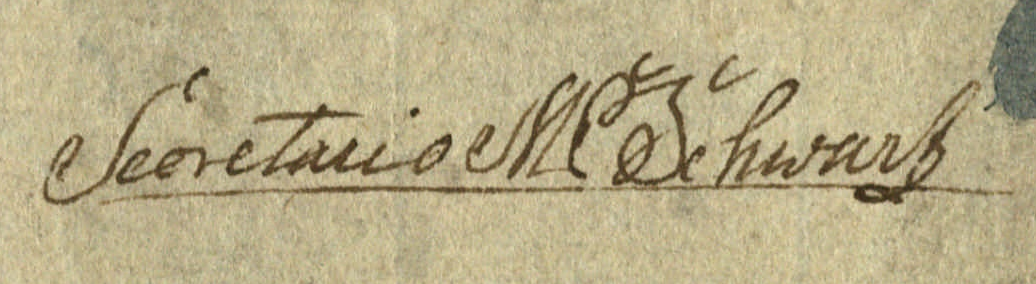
Secretario M. C. Schwartz
